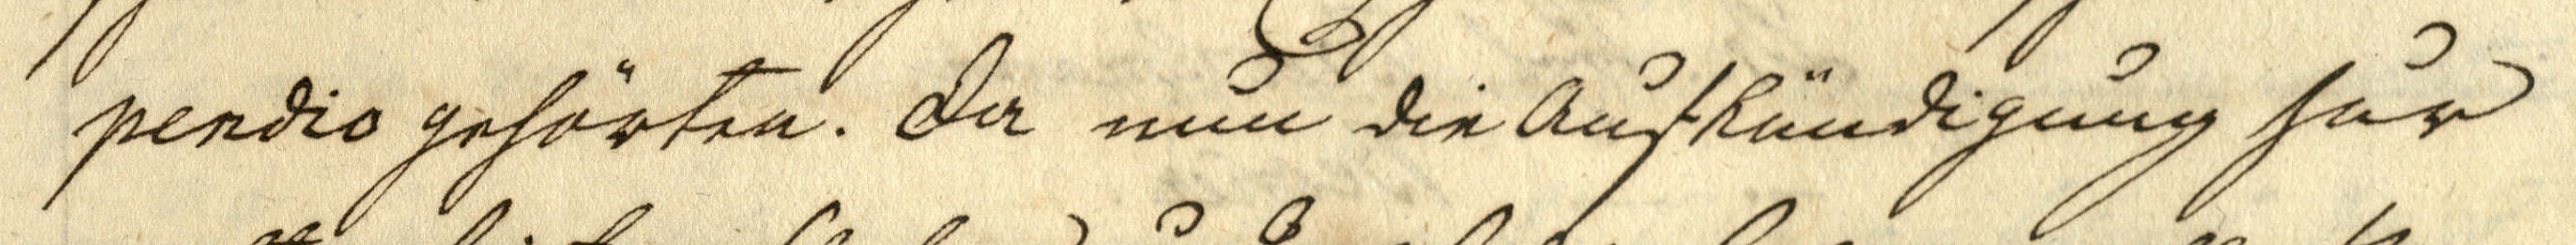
pendio gehörten. Da nun die Aufkündigung zur
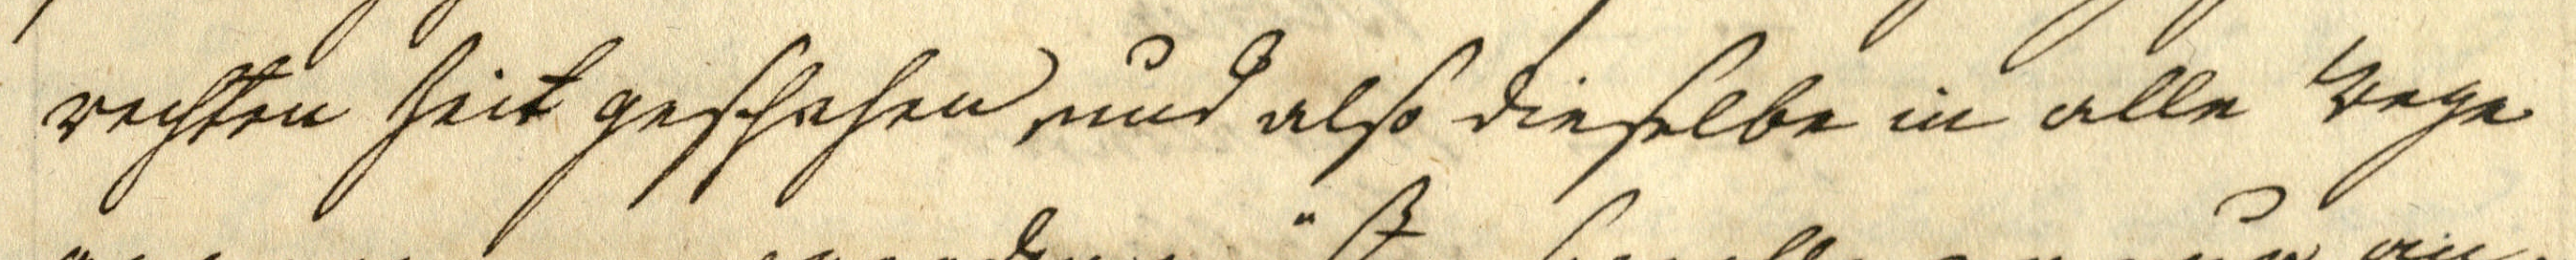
rechten Zeit geschehen und also dieselbe in alle Wege
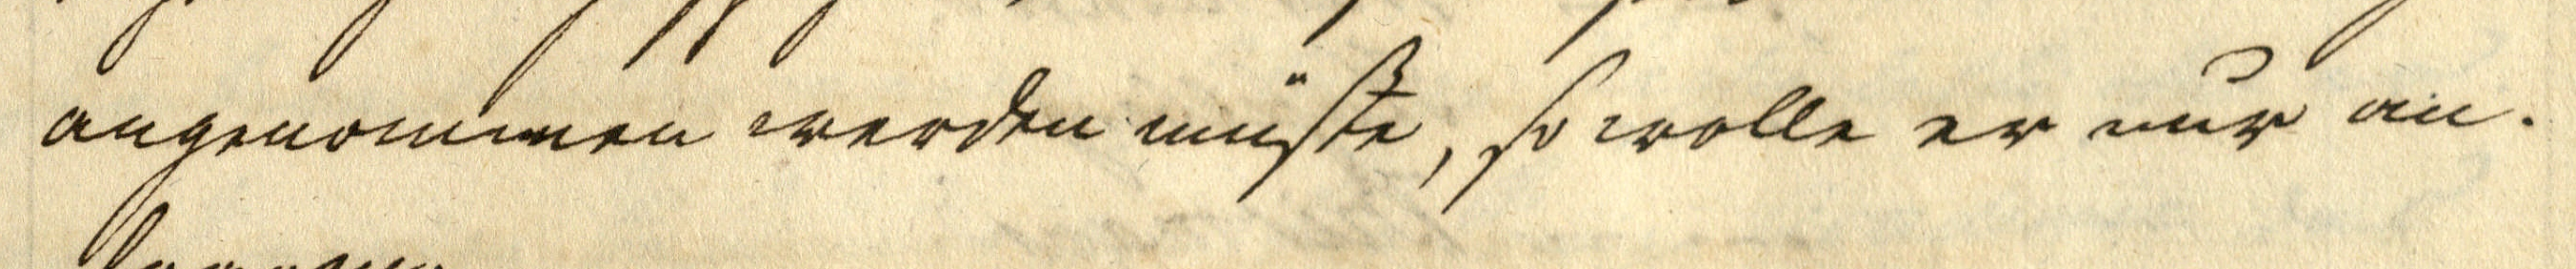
angenommen werden müßte, so wolle er nur an
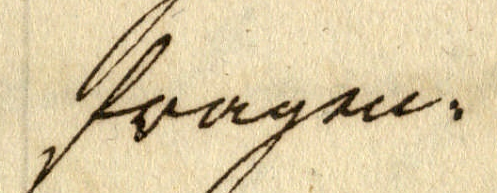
fragen:
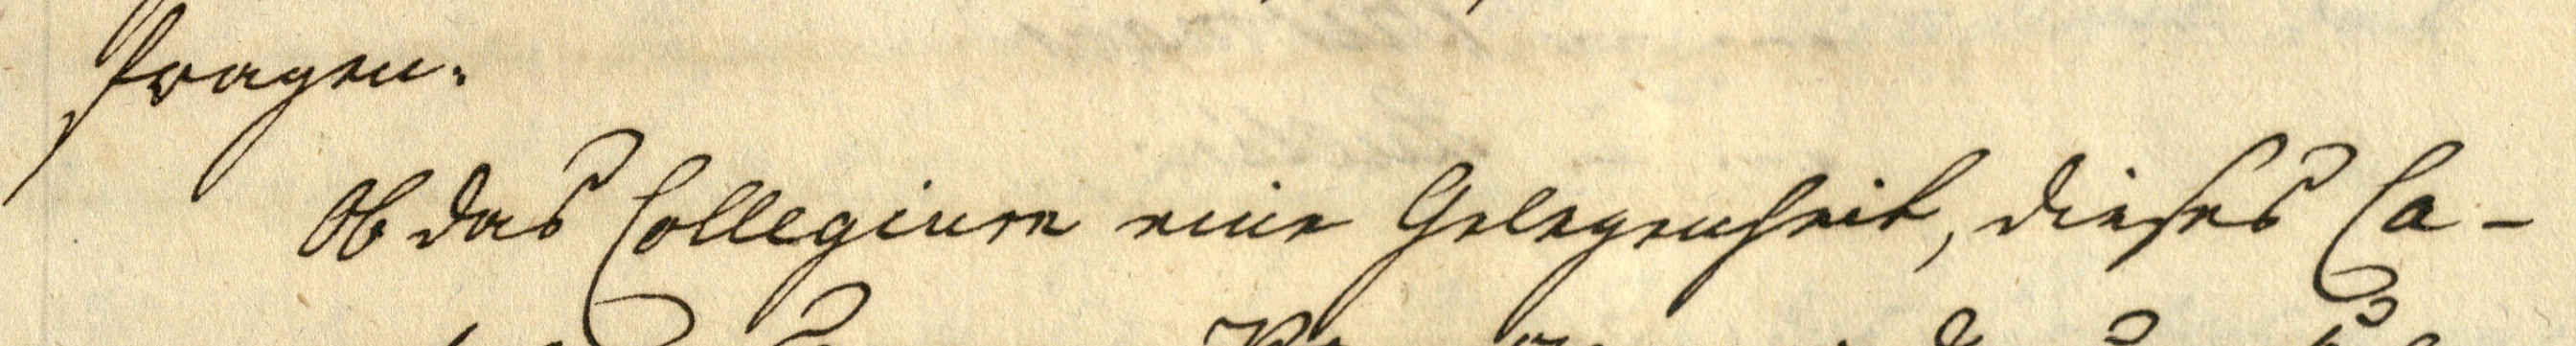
Ob das Collegium eine Gelegenehit, dieses Ca-
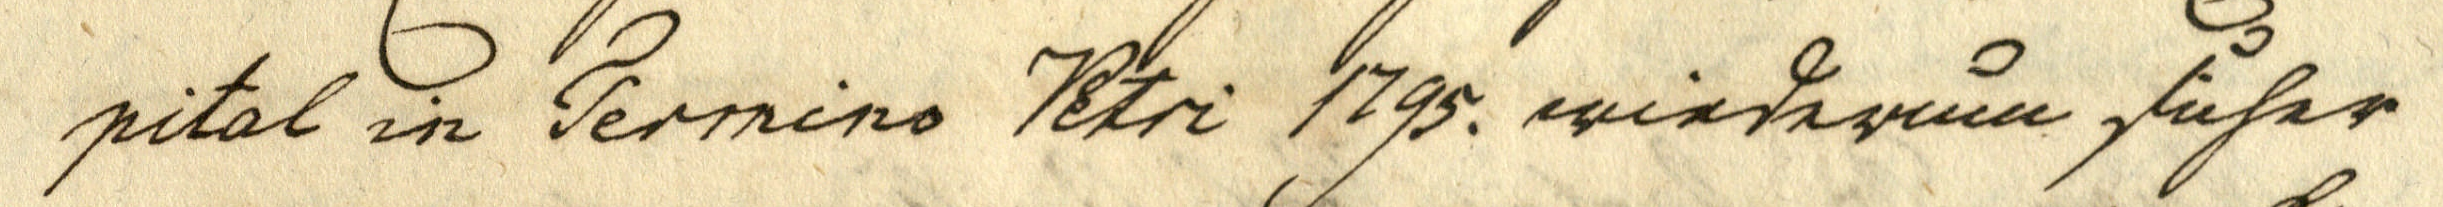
pital in Termino petri 1795. wiederum sicher
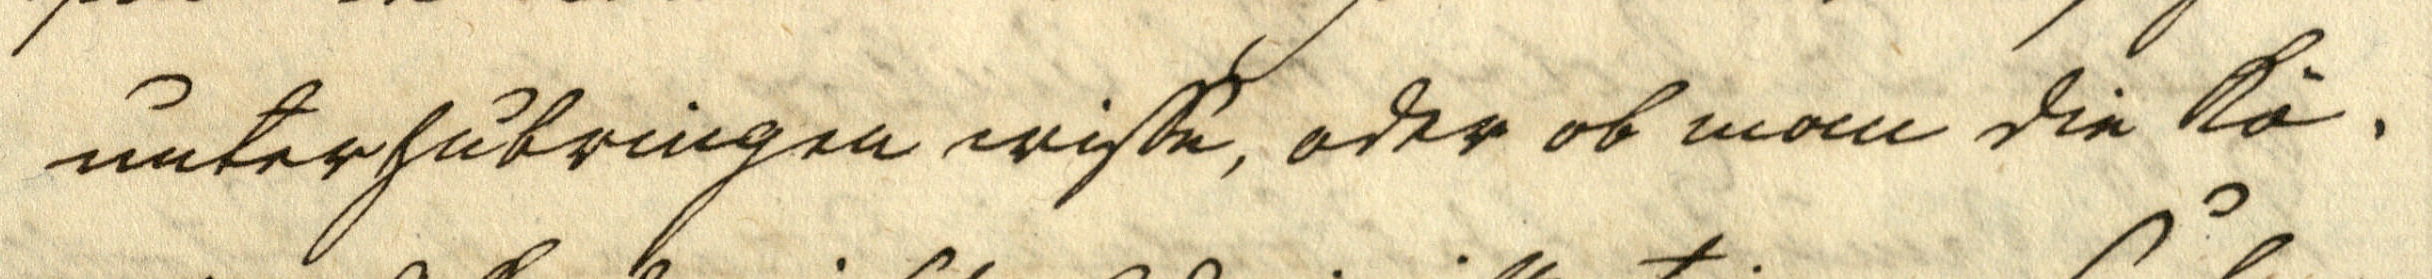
unterzubringen wisse, oder ob man die Kö-
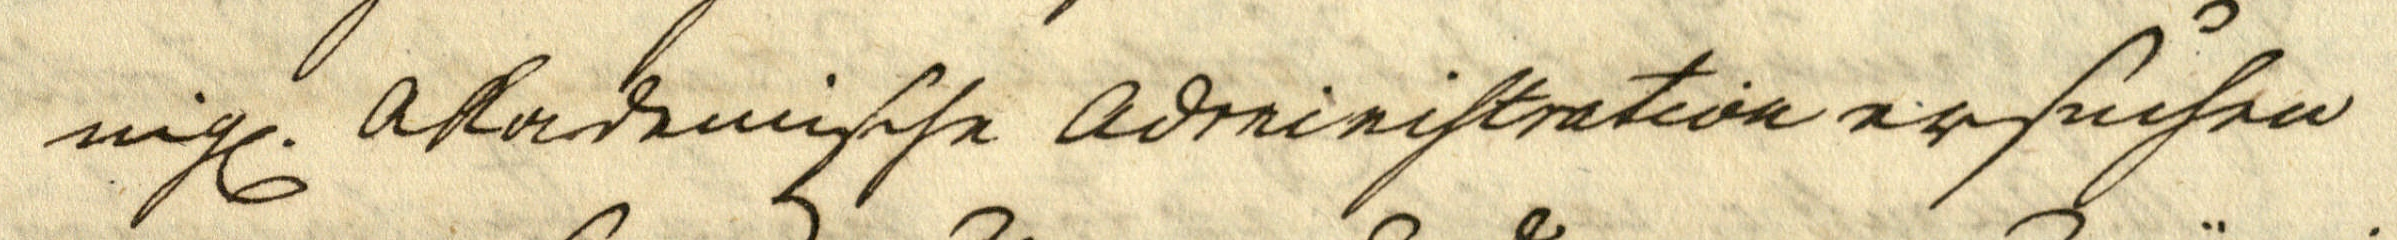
nigl. Akademische Administration ersuchen
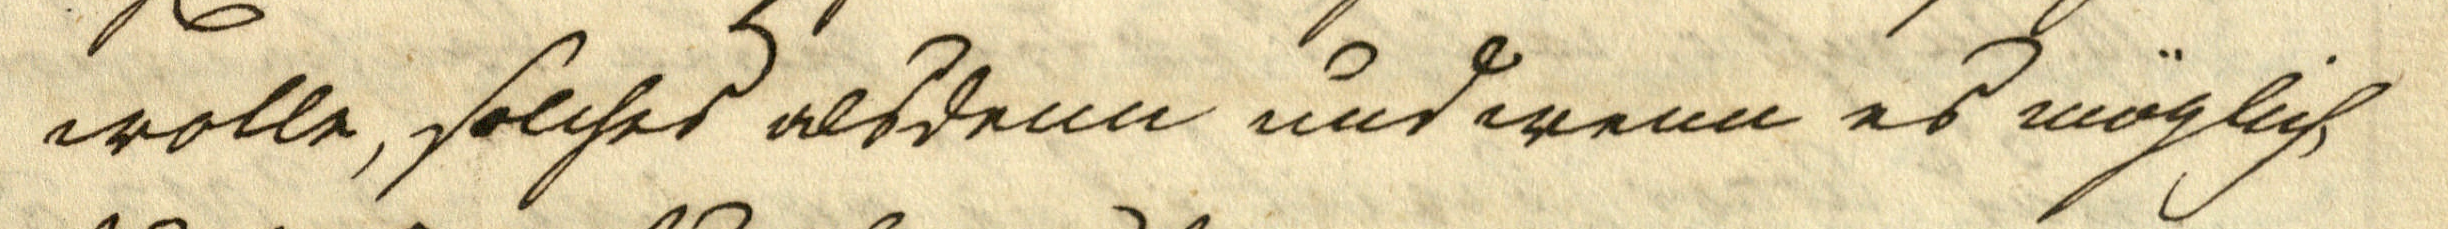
wolle, solches alsdenn und wenn es möglich
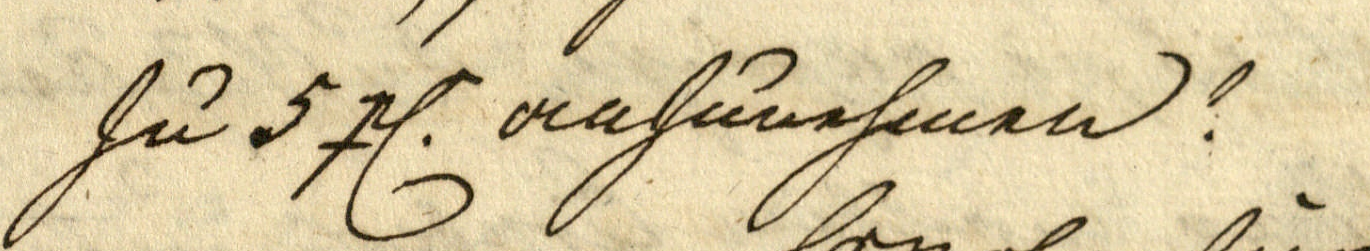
zu 5 pc. anzunehmen?
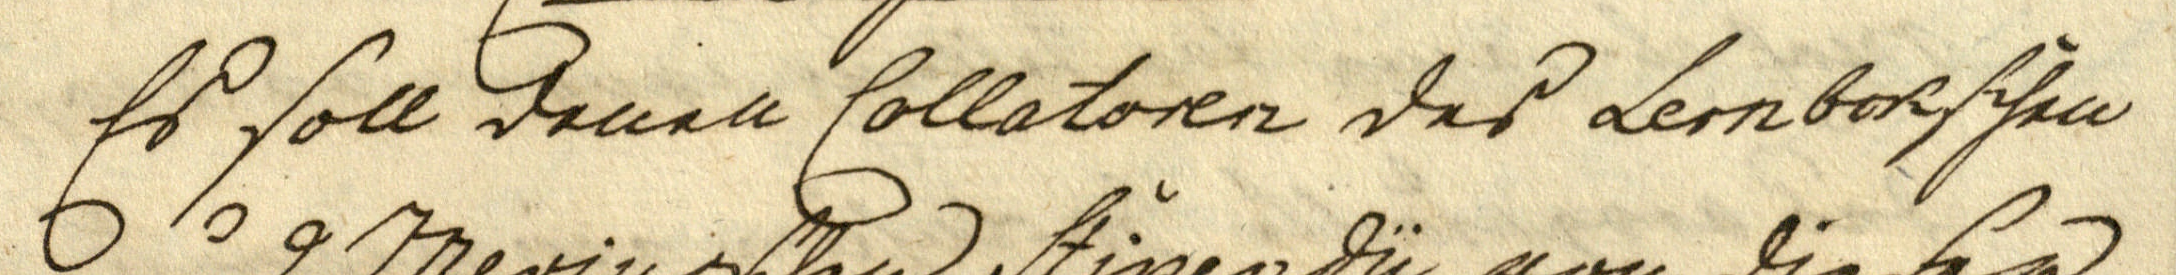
Es soll denen Collatoren des Lembckschen
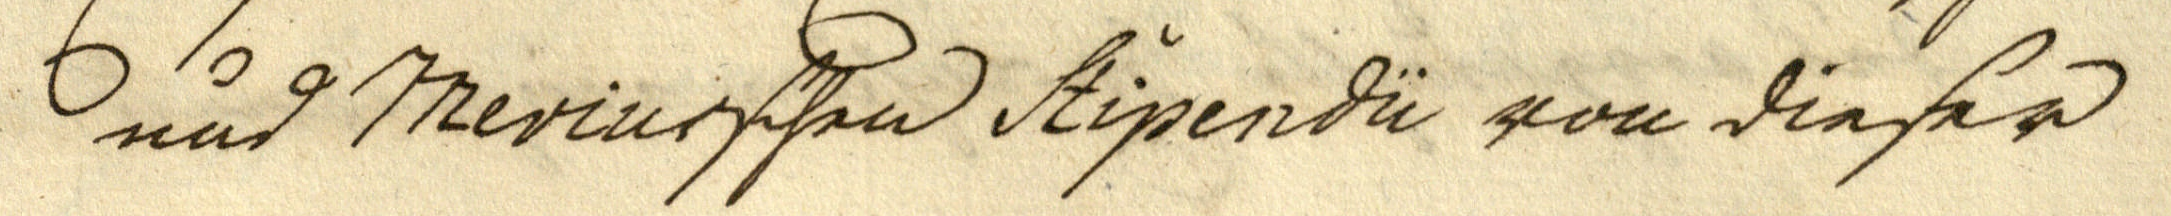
und Meviusschen Stipendii von dieser
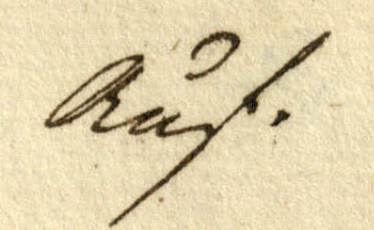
Auf-
